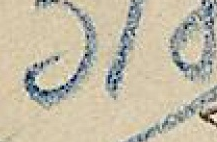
318
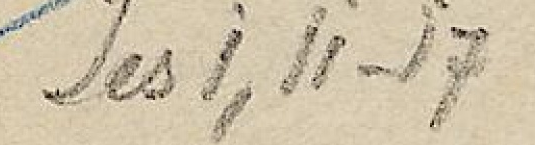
Jes 1,11-17
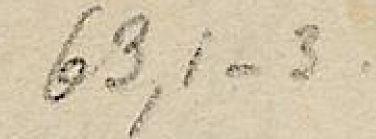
63,1-3
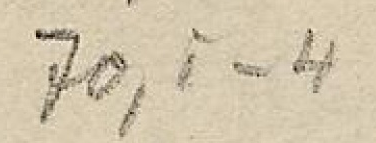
70,1-4
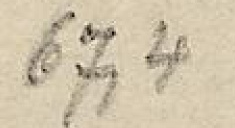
67,4
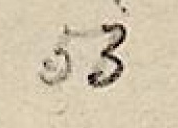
53
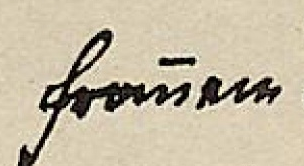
fromen
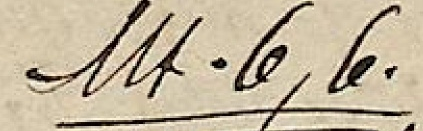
Mt. 6,6.
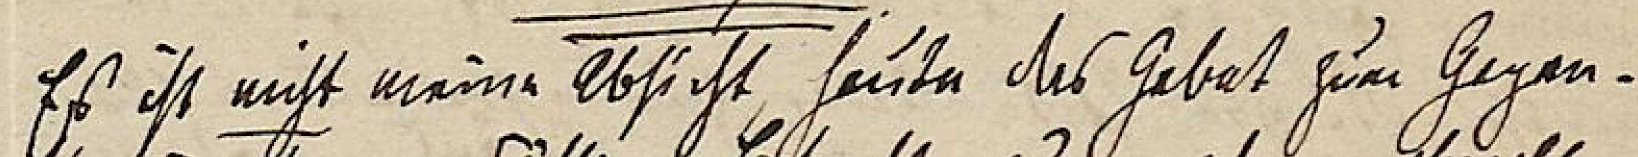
Es ist nicht meine Absicht heute das Gebet zum Gegen¬
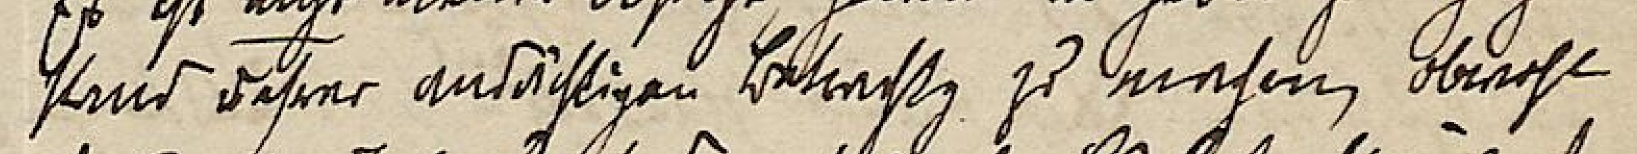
stand unsrer andächtigen Betrachtg zu machen, obwohl
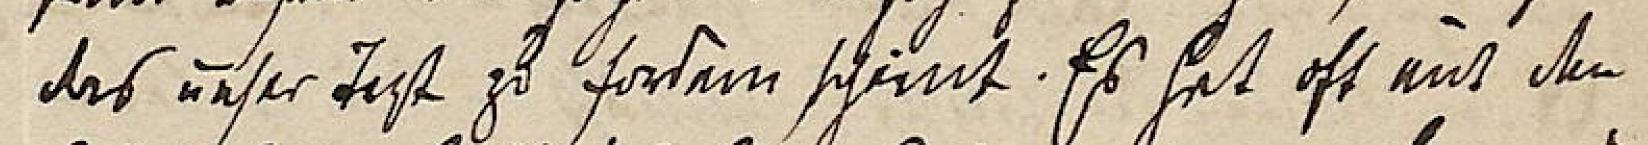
das unser Text zu fordern scheint. Es hat oft mit den
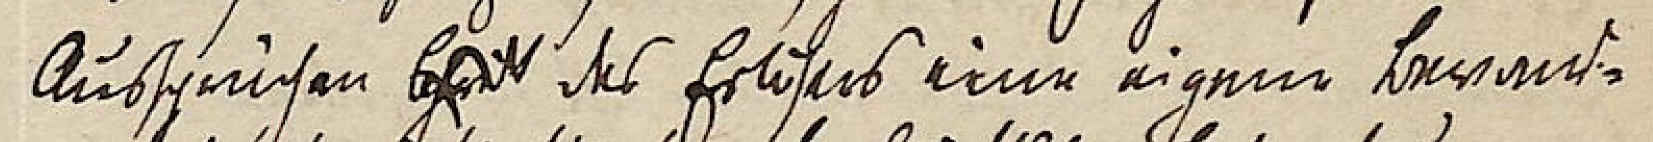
aussprüchen Chr. des Erlösers eine eigne Bewand¬
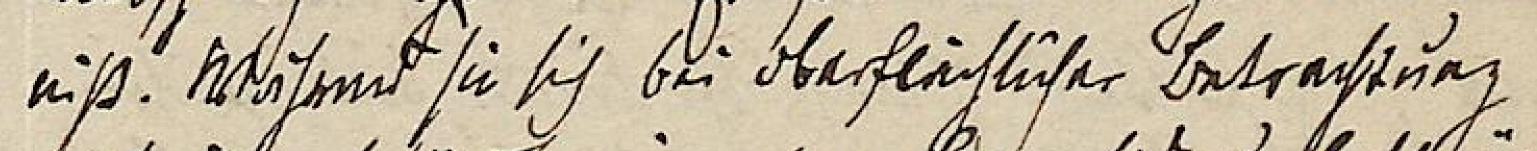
niß. Während sie sich bei oberflächlicher Betrachtung
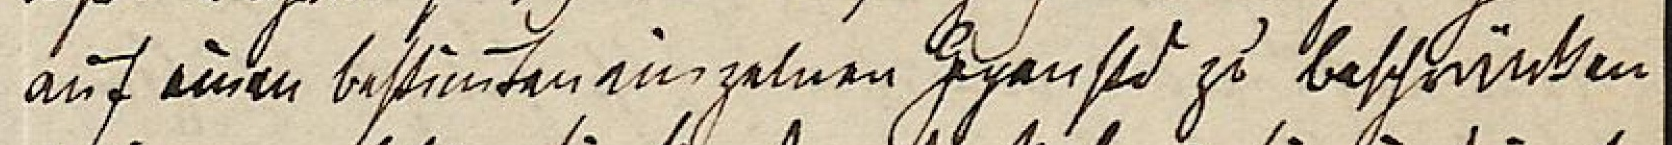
auf einen bestimten einzelnen Gegenstd zu beschränken
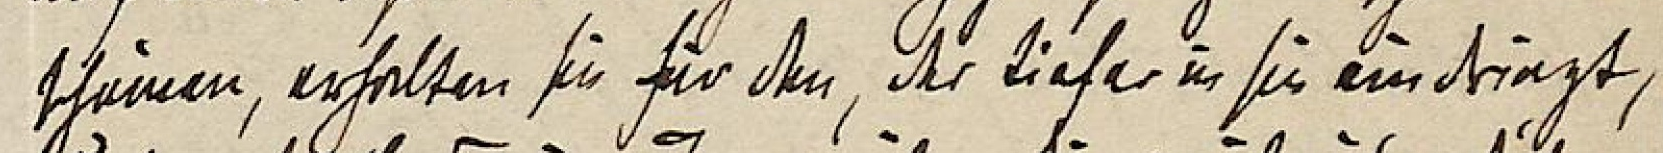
scheinen, erhalten sie für den, der tiefer in sie eindringt,
